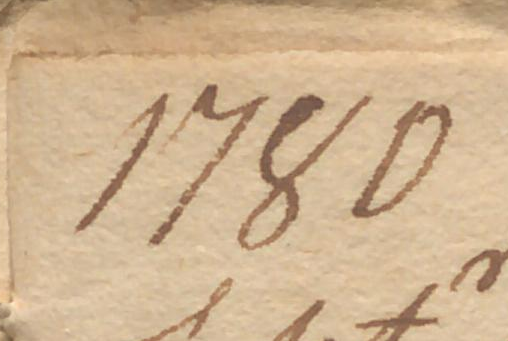1780
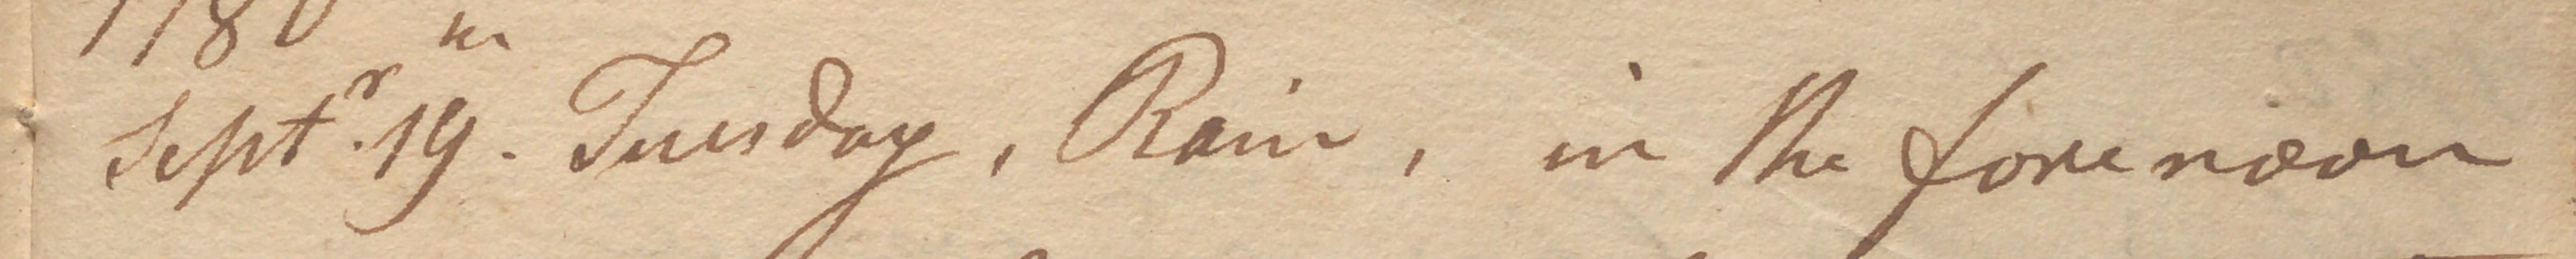Sept^r. 19^th. Tuesday, Rain, in the forenoon
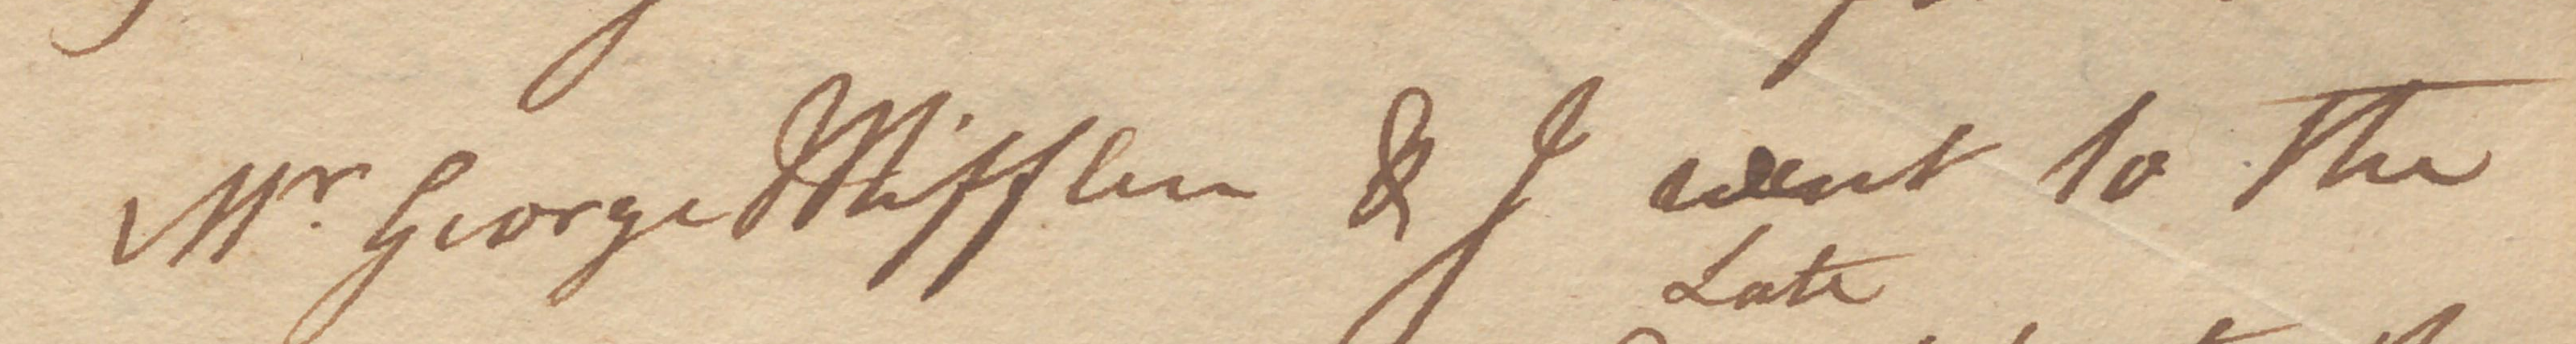M^r. George Mifflin & I went to the
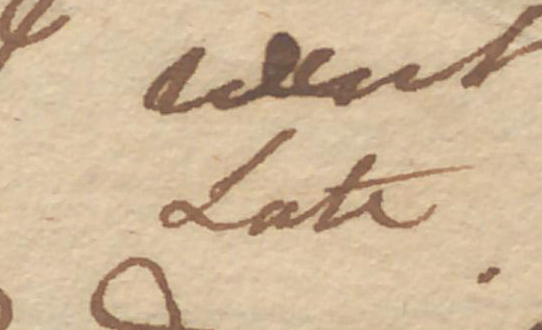Late
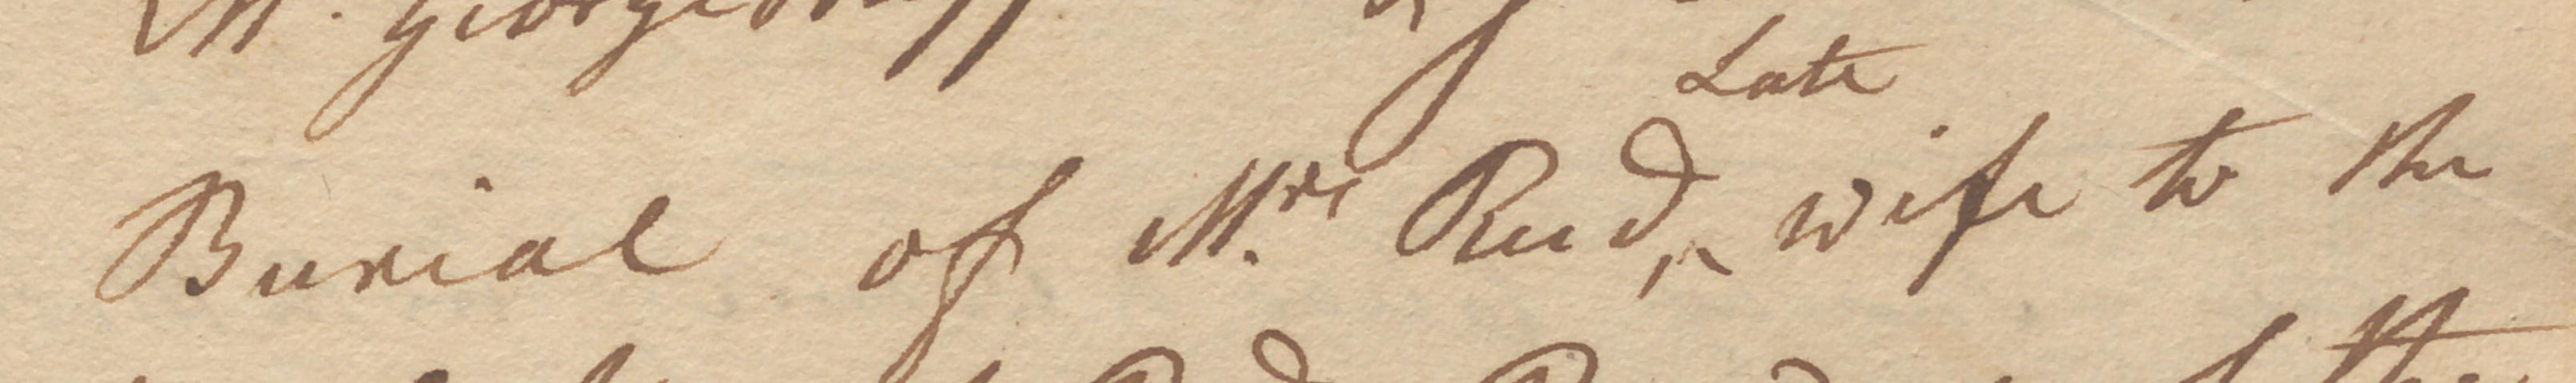Burial of M^rs. Reed ^ wife to the
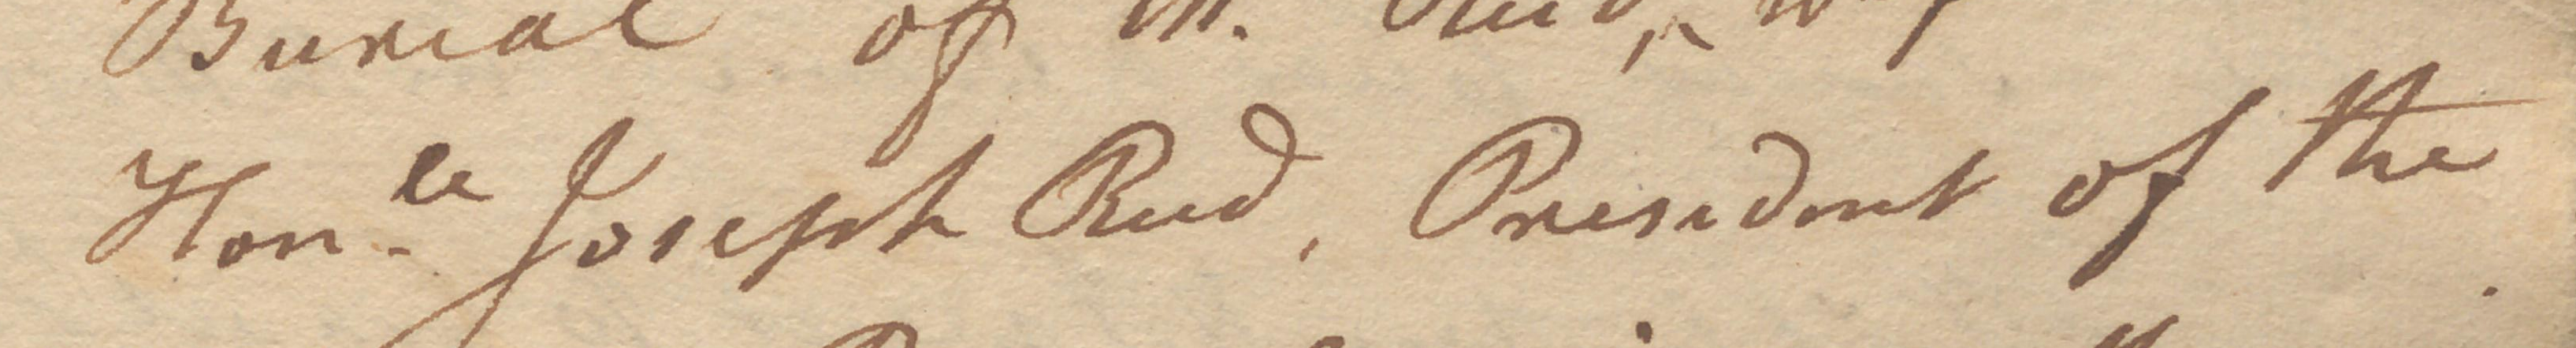Hon^le. Joseph Reed President of the
